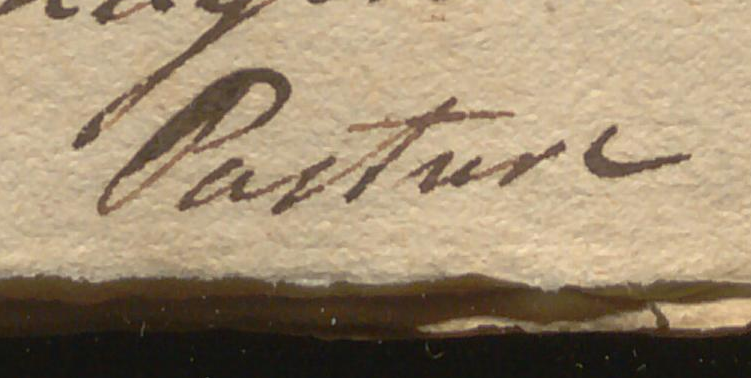Pasture
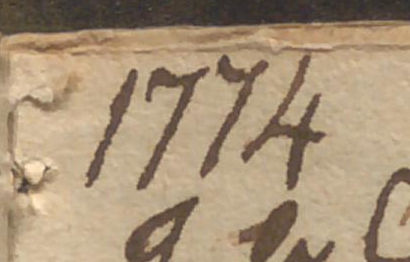1774
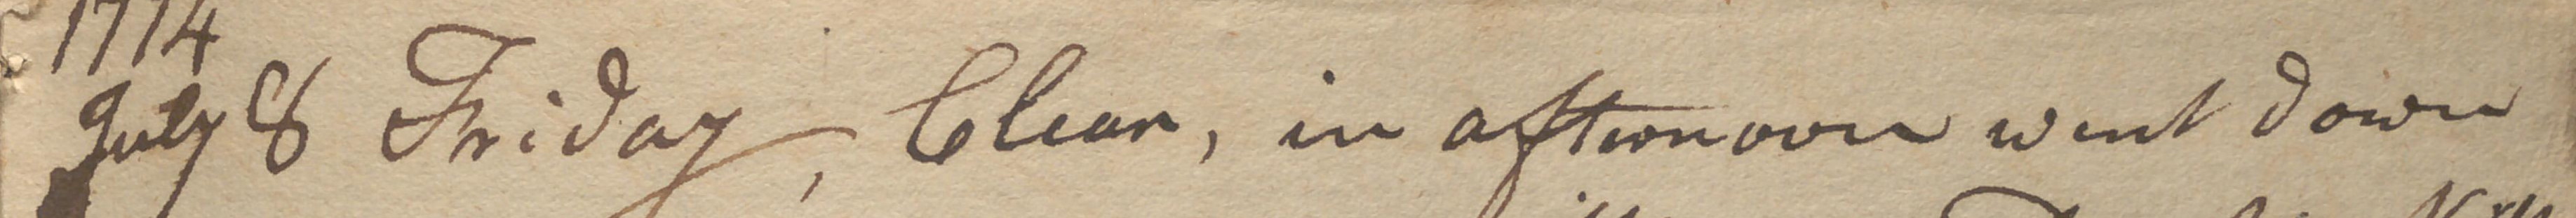July 8 Friday Clear, in afternoon went down
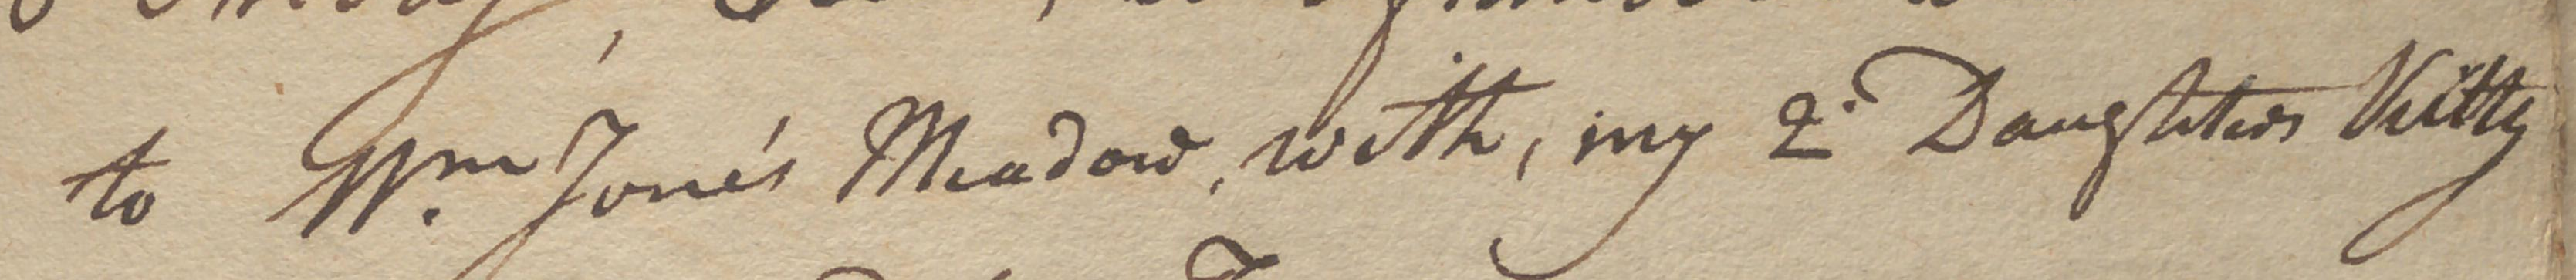to W^m. Jone's Meadow, with, my 2 Daughters Kitty
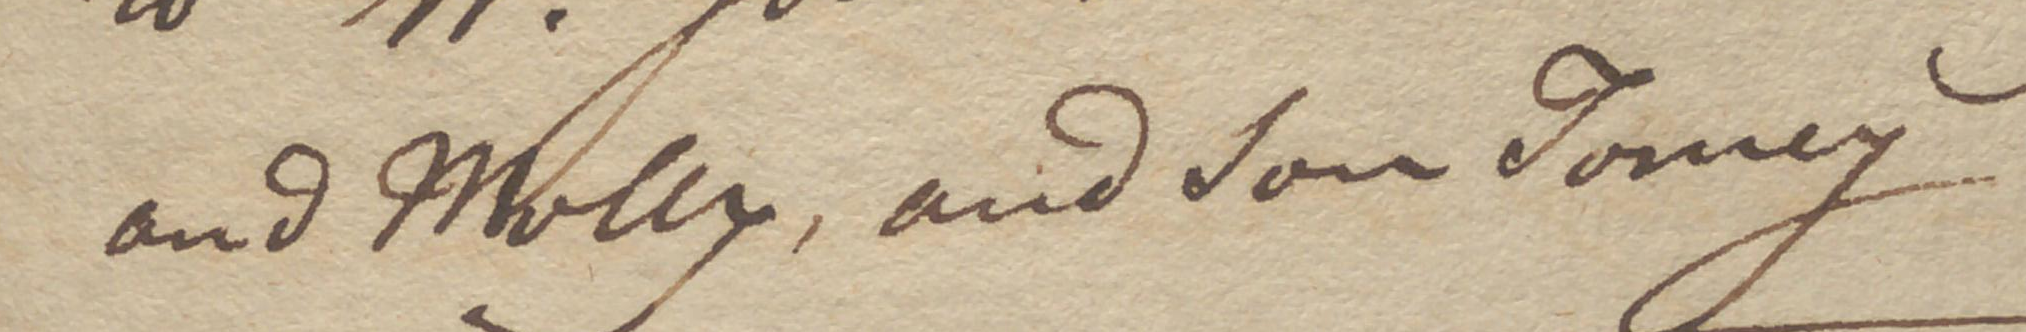and Molly, and son Tomey
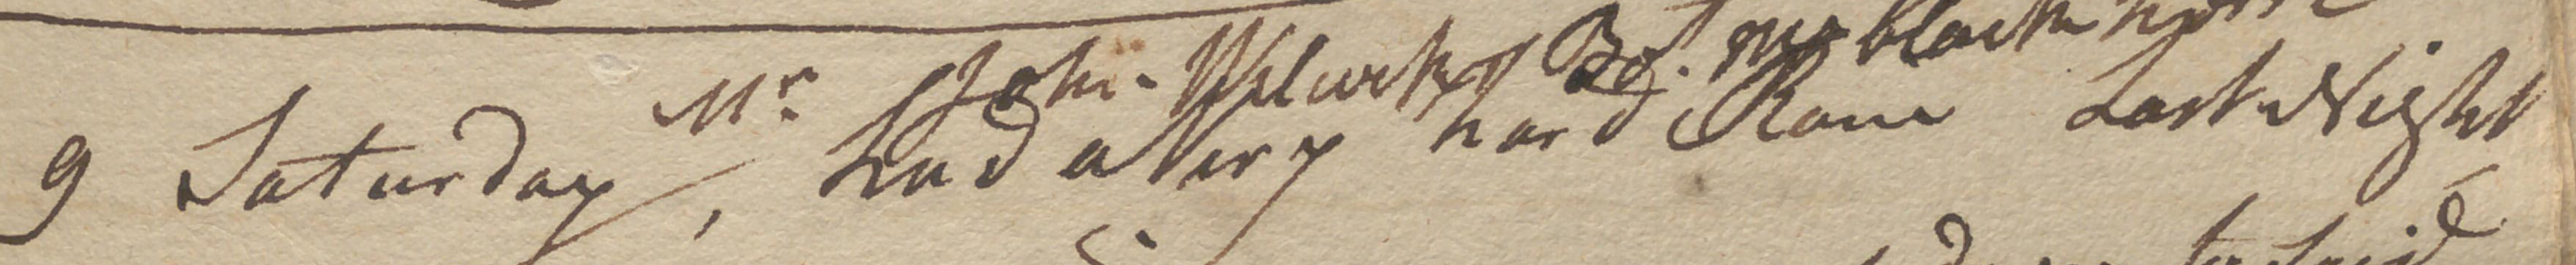9 Saturday, had a Very hard Rain Last Night
